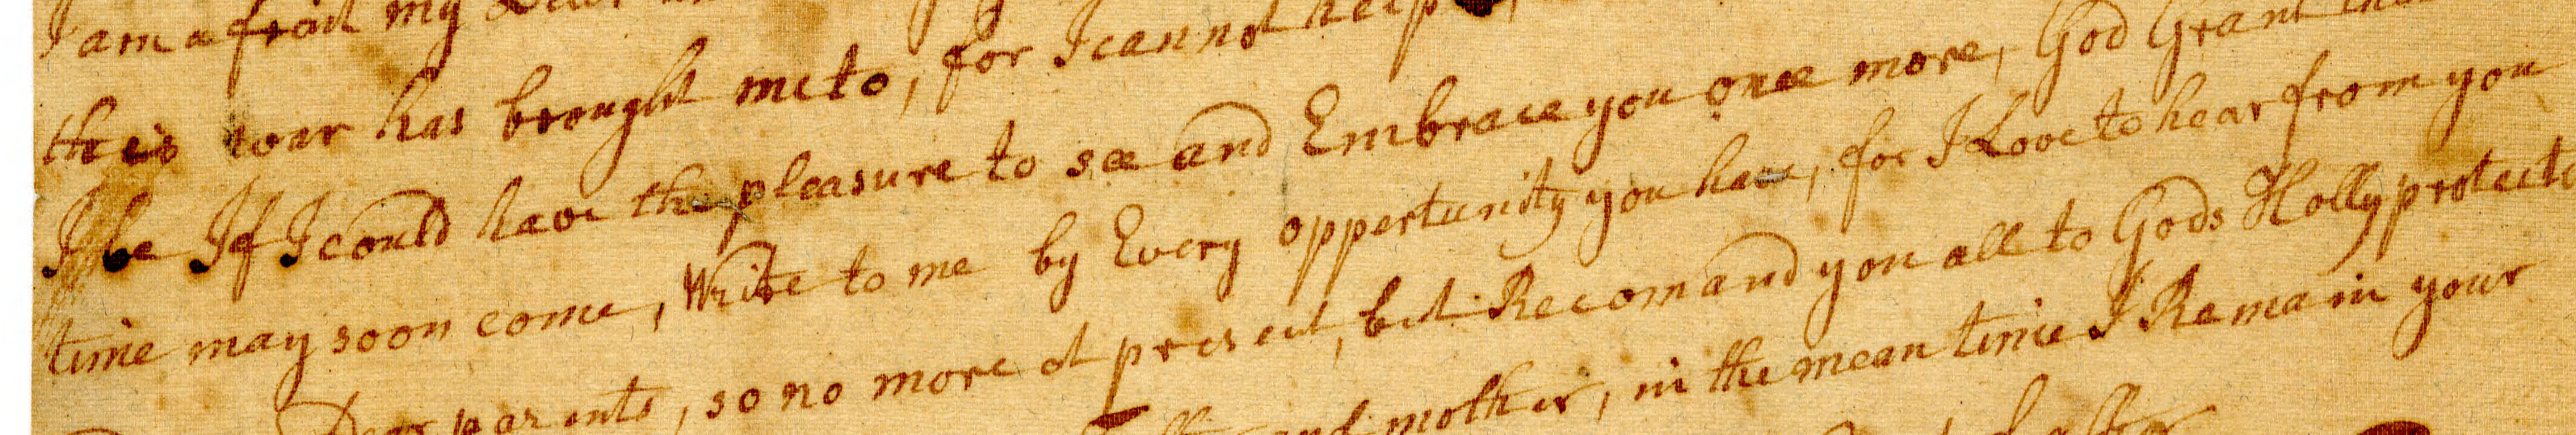time may soon come, Write to me by Every opportunity you have, for I Love to hear from you
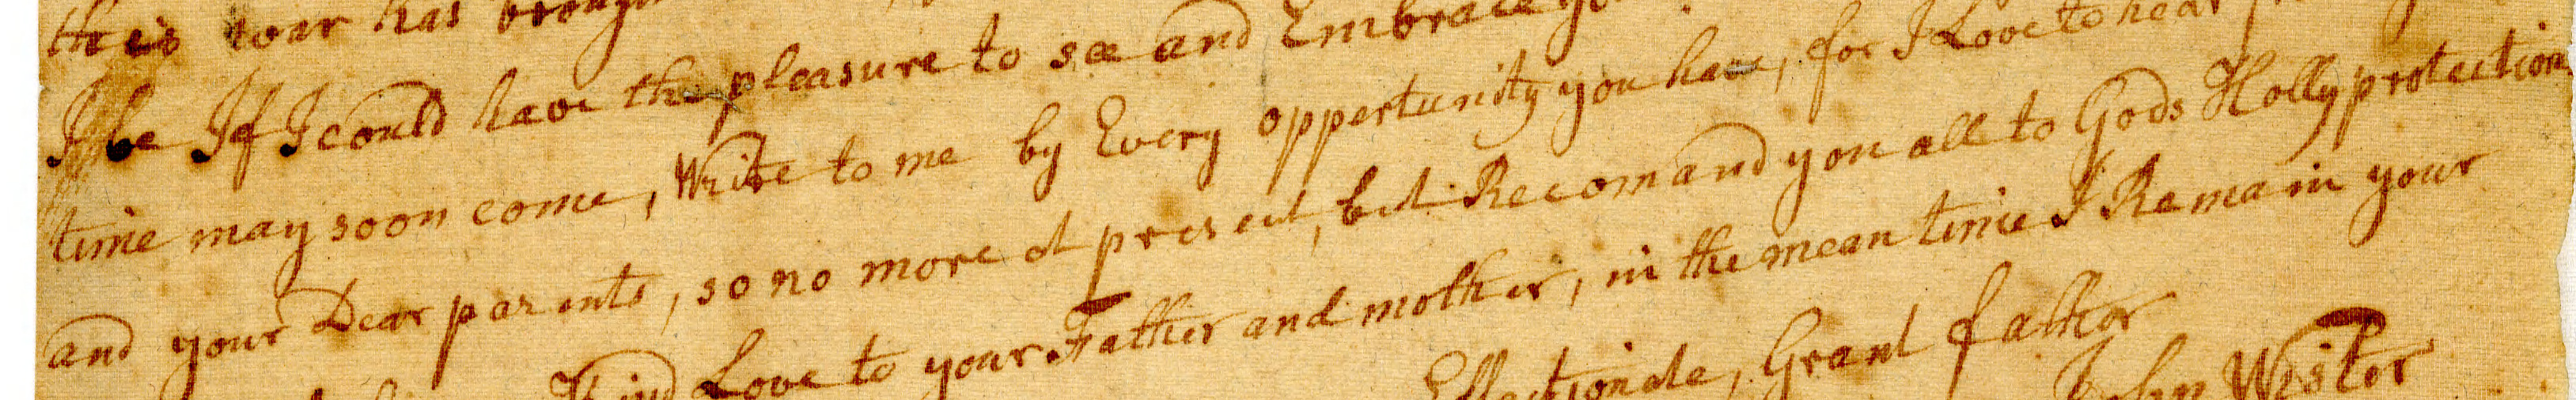and your Dear parents, so no more at present, but Recomand you all to Gods Holly protection
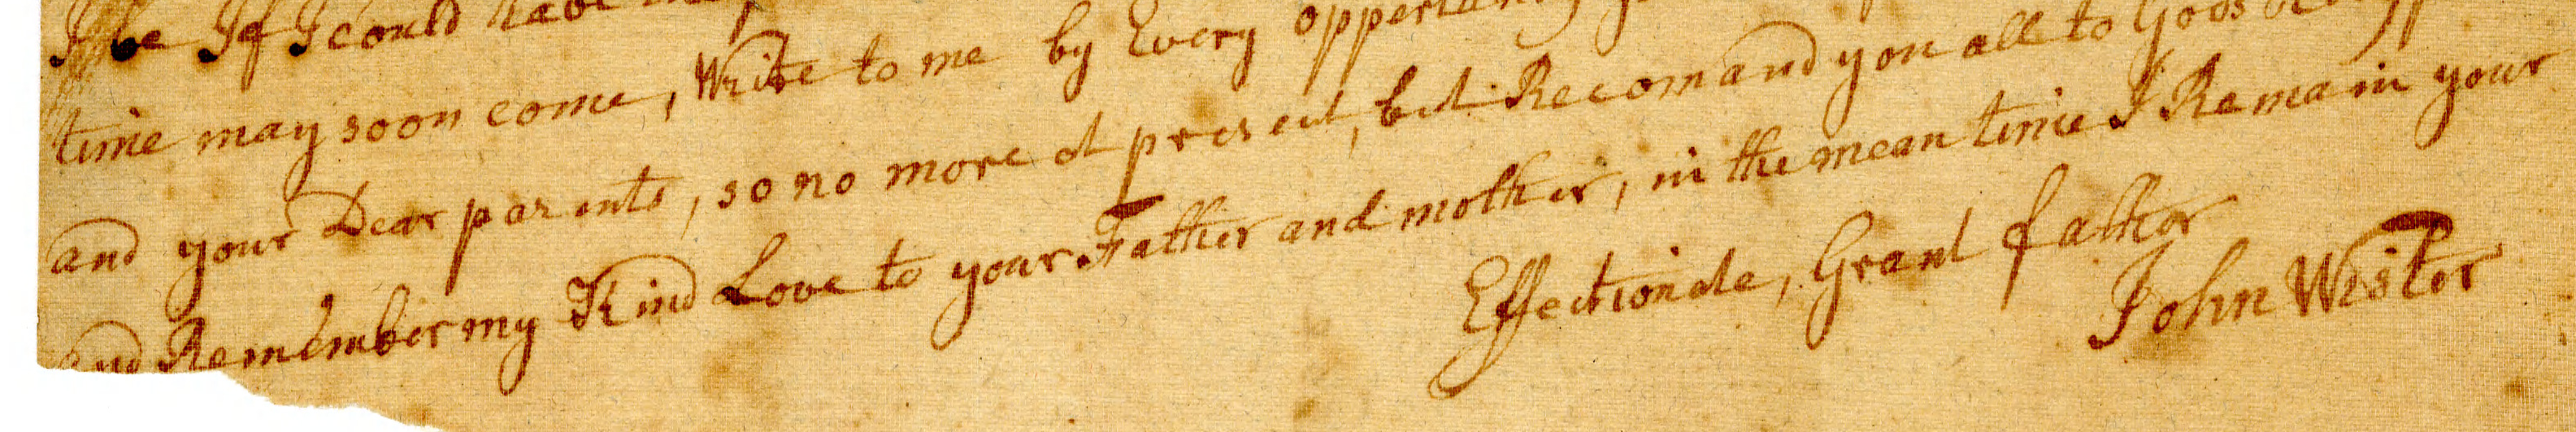and Remember my Kind Love to your Father and mother, in the mean time I Remain your
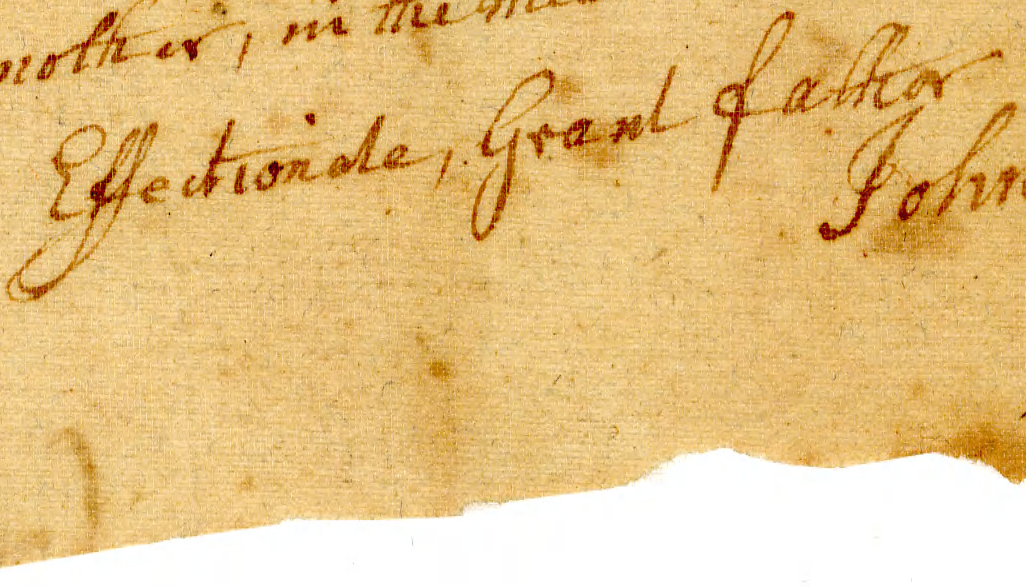Effectionate, Grant father
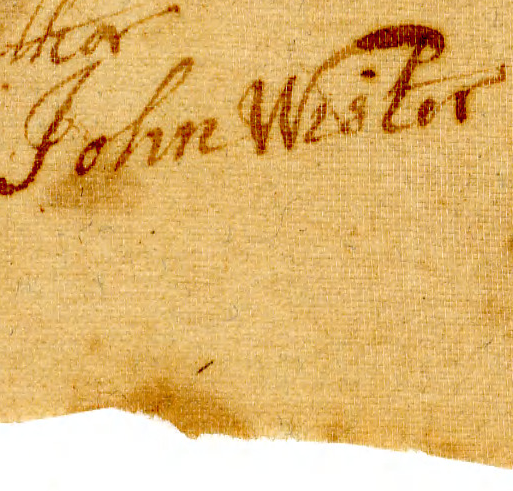John Wister
